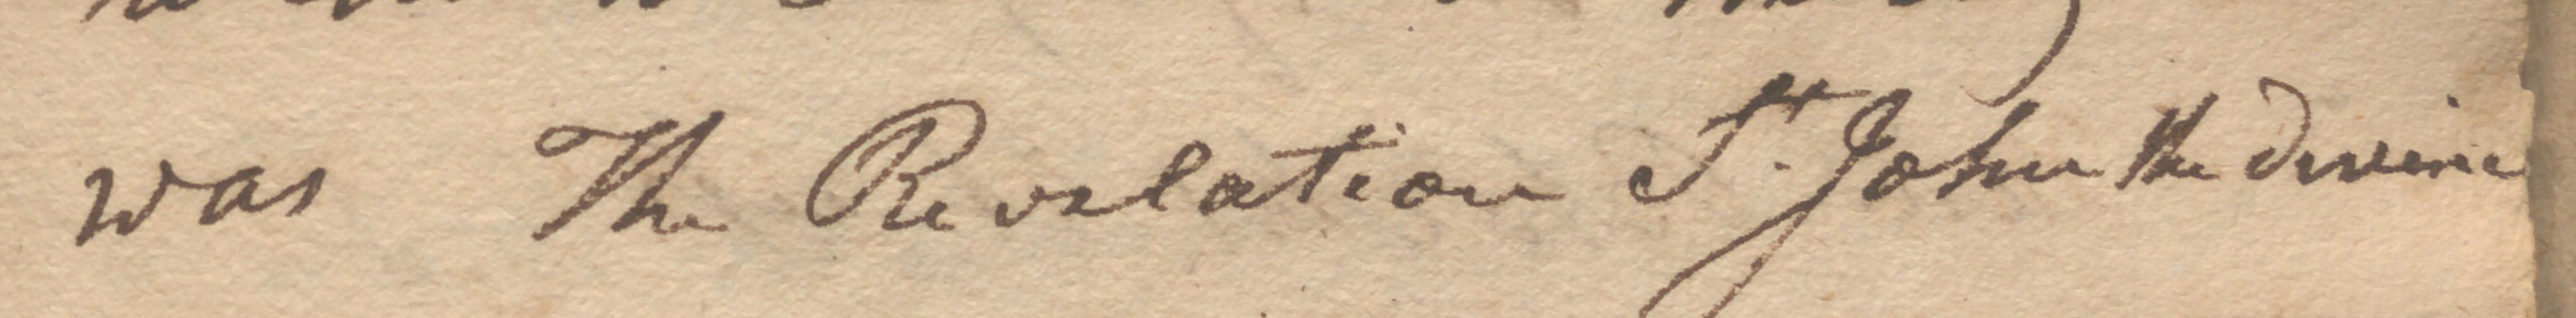was The Revelation S^t. John the divine
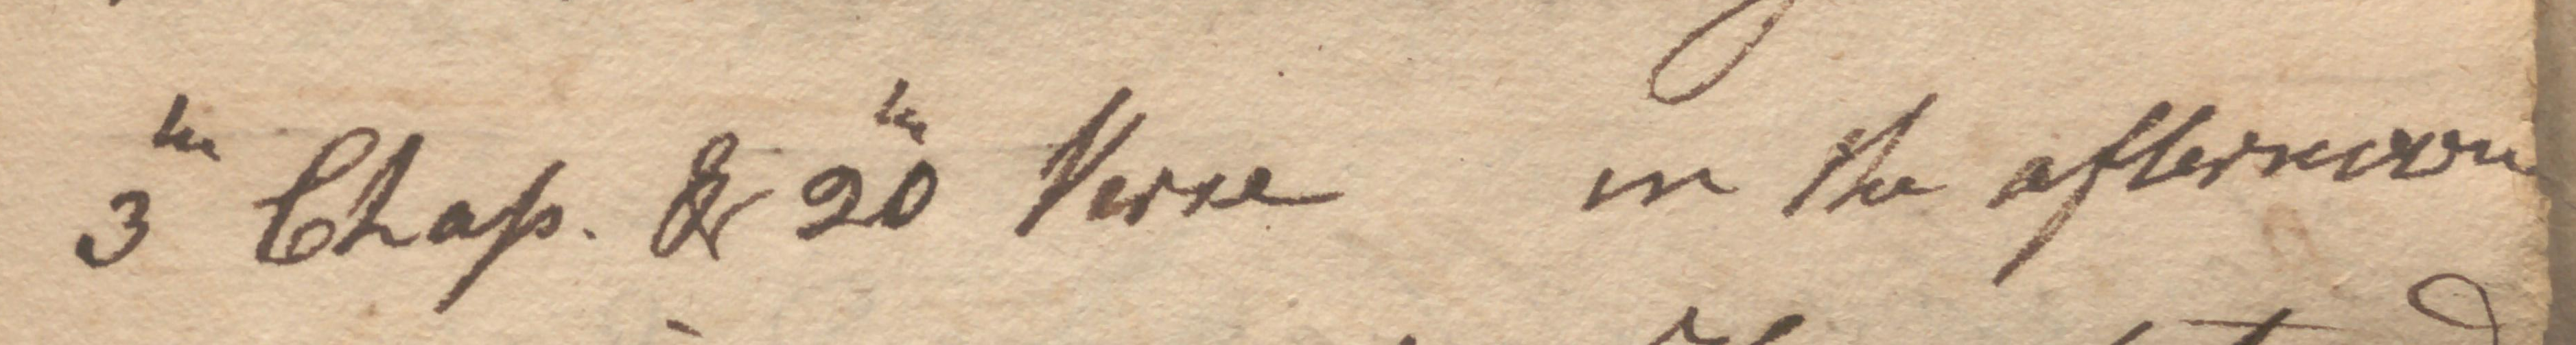3^th Chap. & 20^th Verse in the afternoon
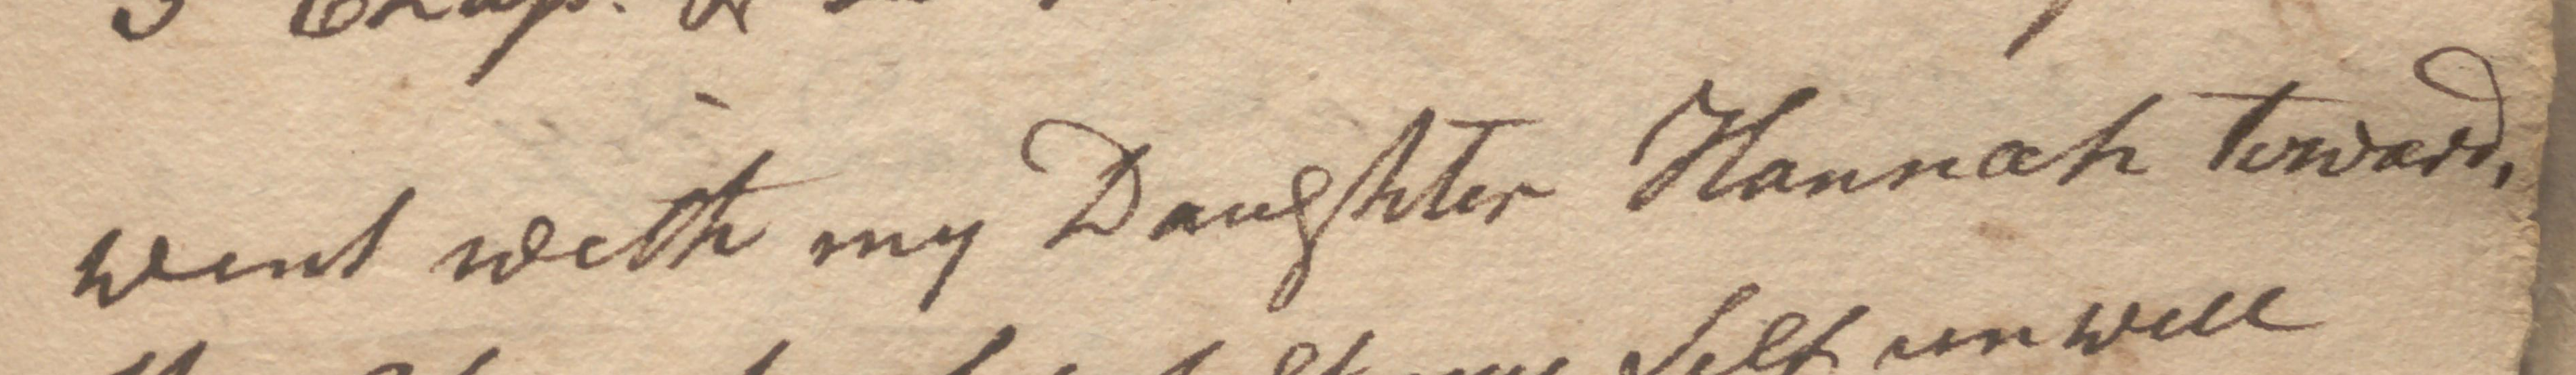went with my Daughter Hannah toward
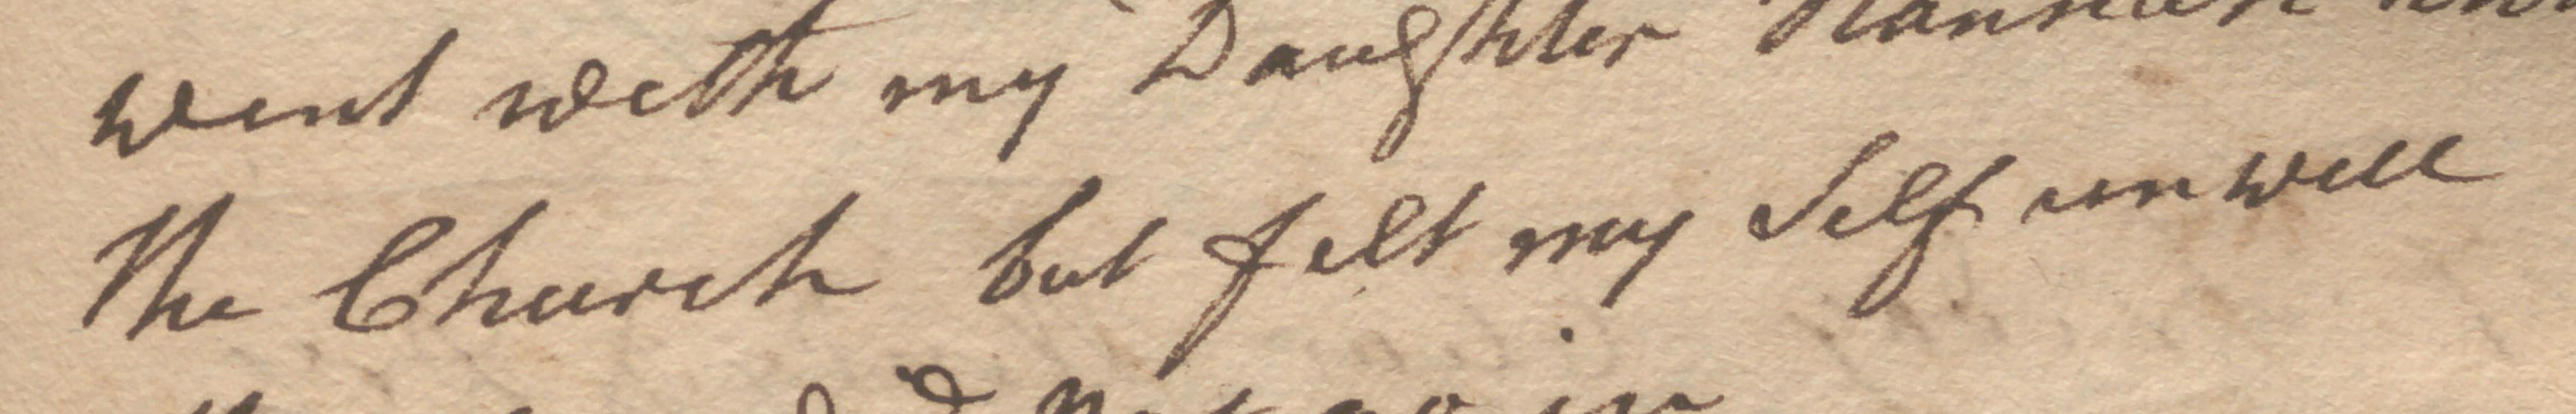the Church but felt my self unwell
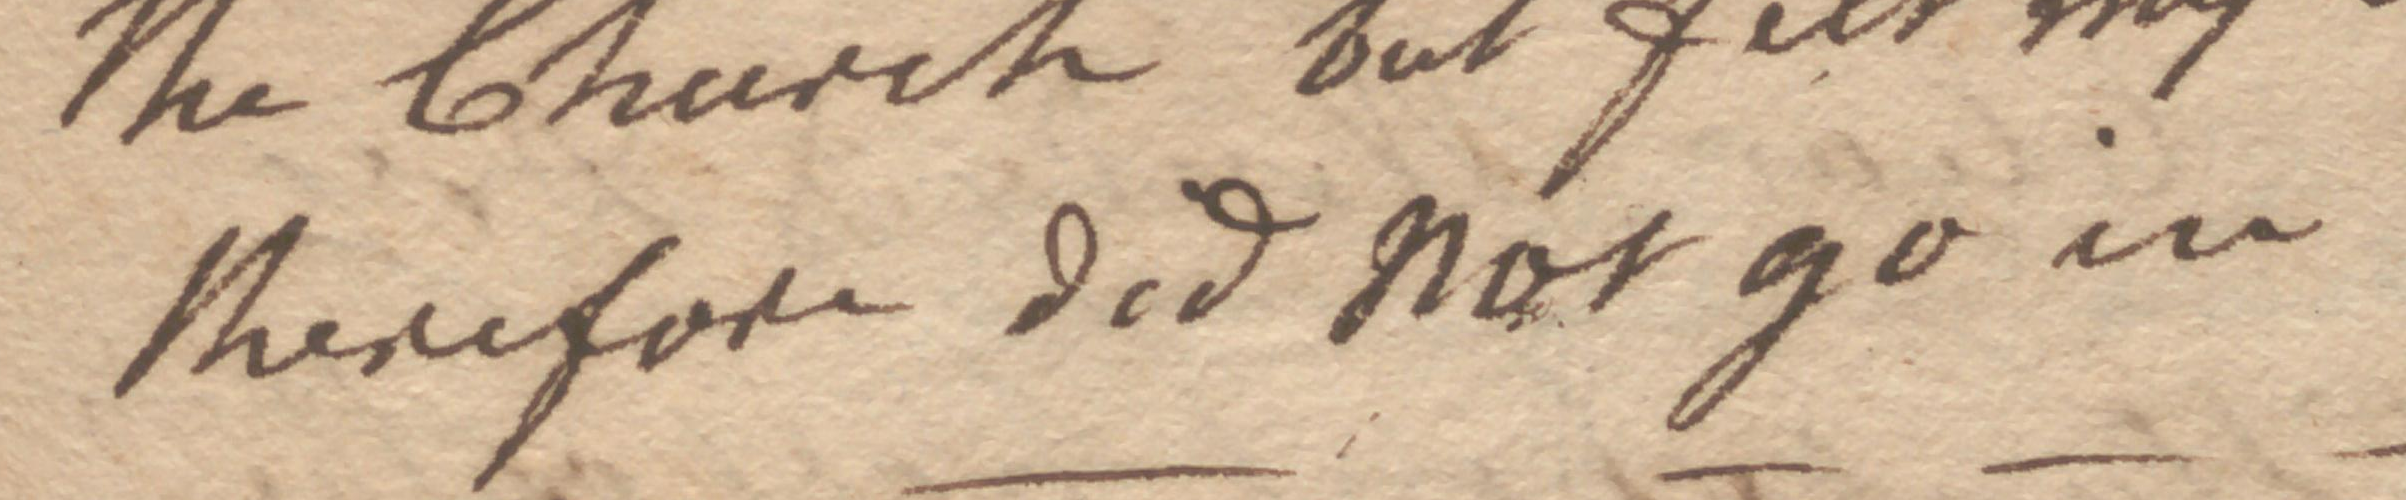therefore did not go in
